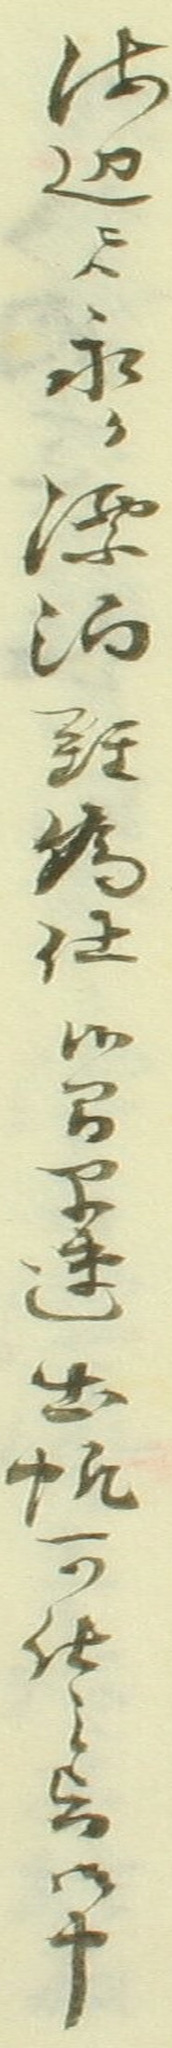海辺には永く漂泊難為仕候間早速出帆可仕之旨御申
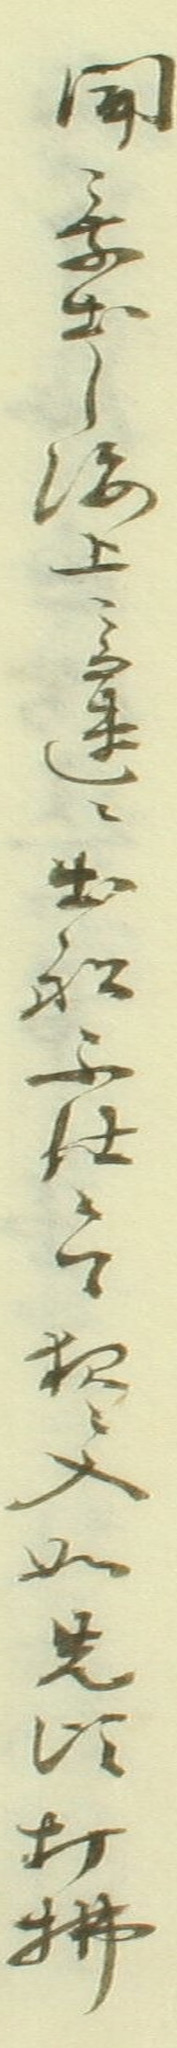聞乗出し海上に而速に出航不仕候はゝ夜に入如先頃打払
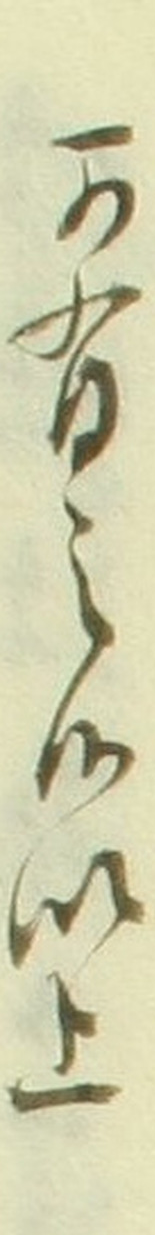可有之候以上
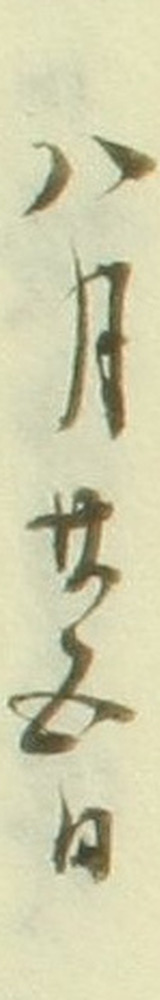八月廿五日

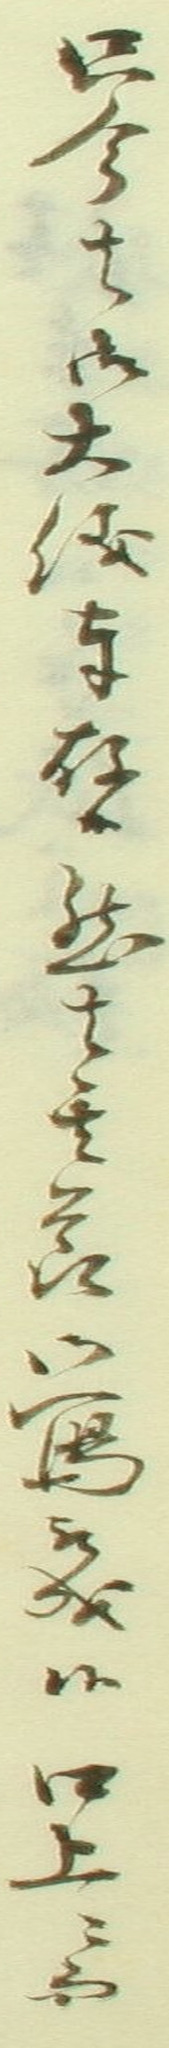只今は御大儀奉存候然は其節御写被成候口上に而
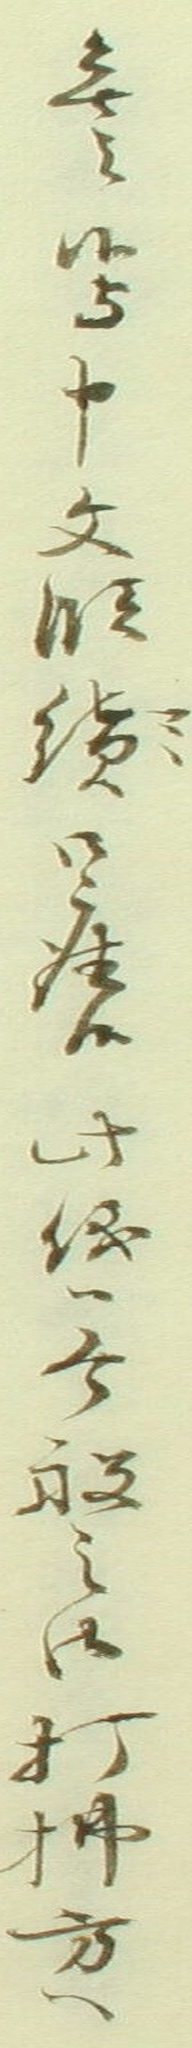無之候与文段積御座候此儀は今般之御打払方へ
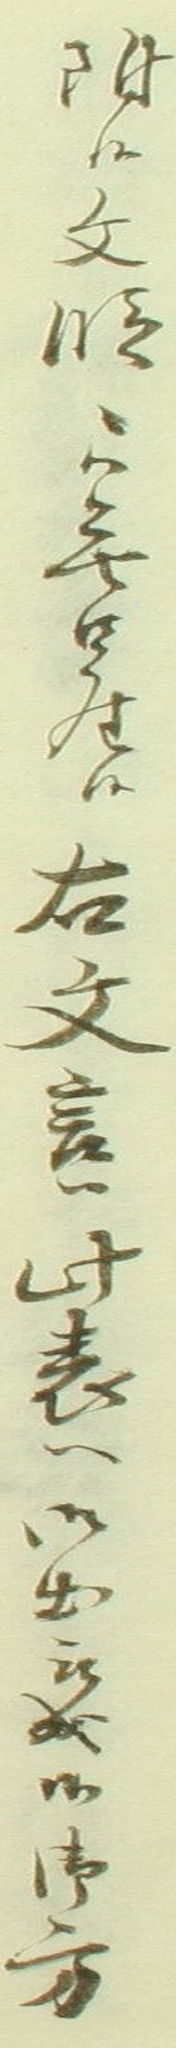附候文段には無御座候右文言は此表へ御出被成候御方
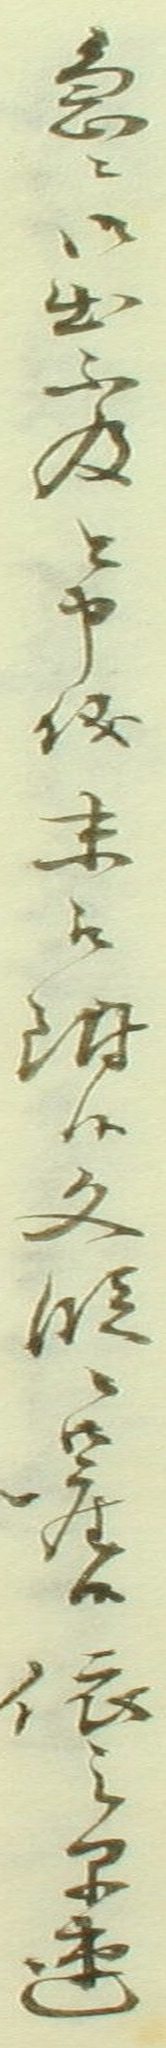急に御出不及と申儀末え附候文段に御座候依之早速
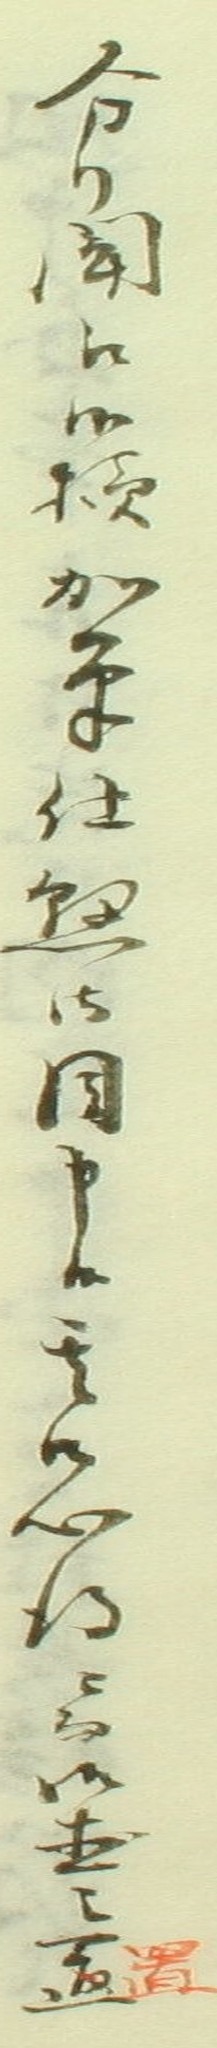分り聞え候加筆仕懸御目申候其心得に而直し置置
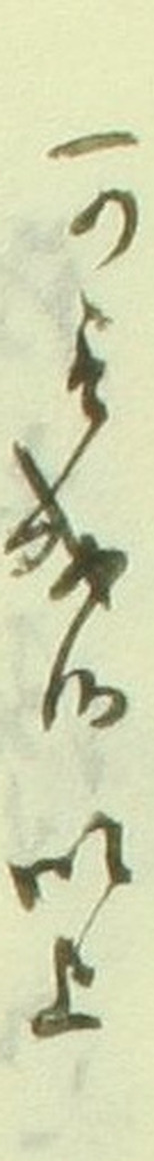可被成候以上
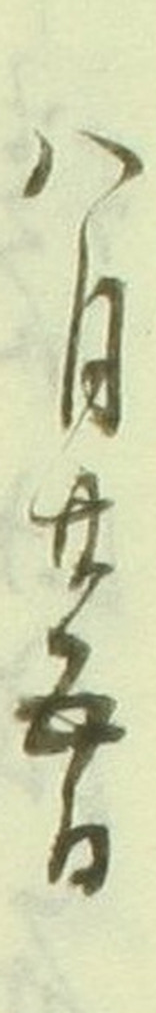八月廿五日
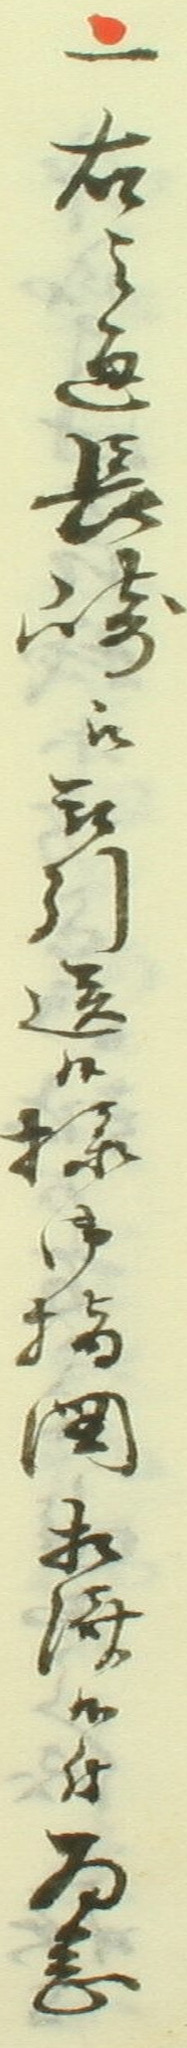一右之通長崎え被引送候様御指図相済候付為念
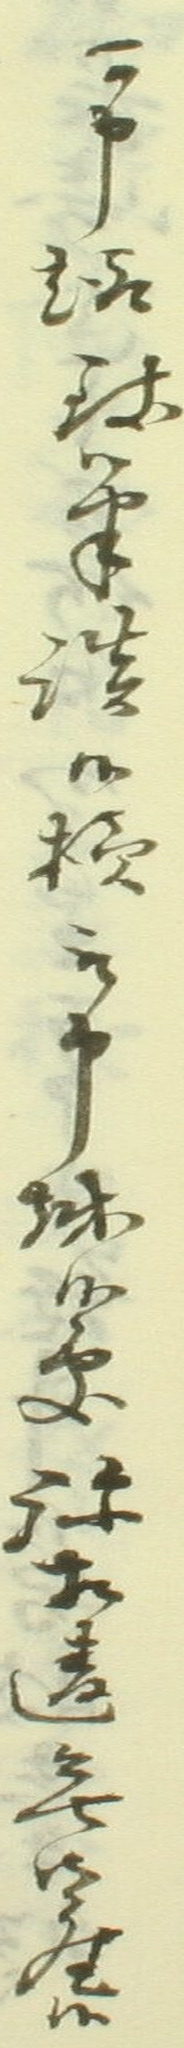可申趣致御筆談候様被申越候処弥相違無御座候
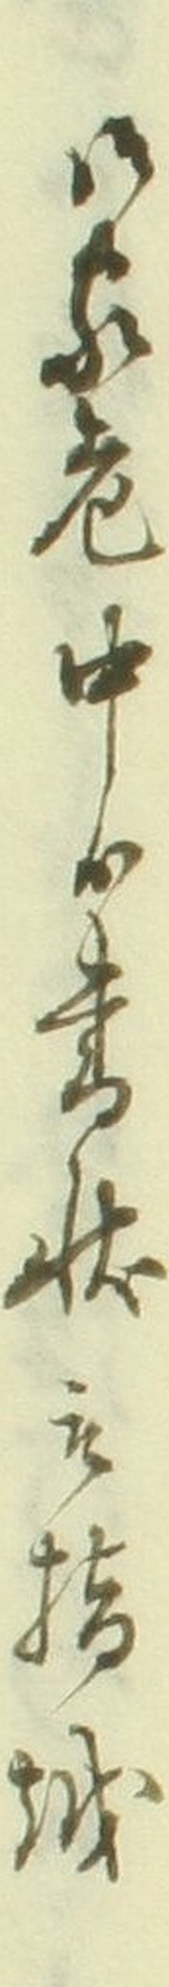御家老中ゟ書状被指越
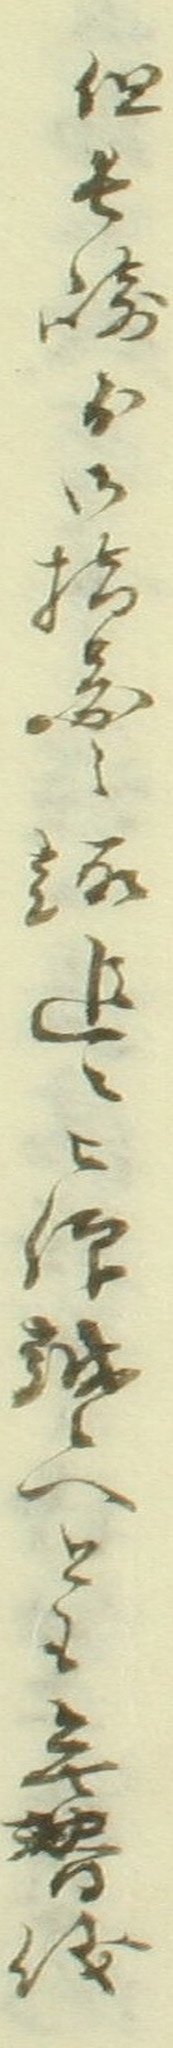但長崎ゟ御指図之趣追々被仰越候へとも無替儀
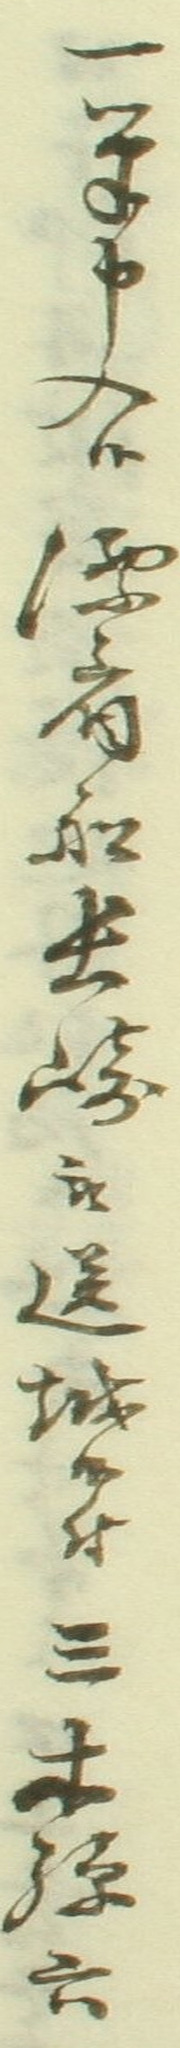一筆申入候漂着船長崎え送越候付三木孫六
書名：異国船漂着記
